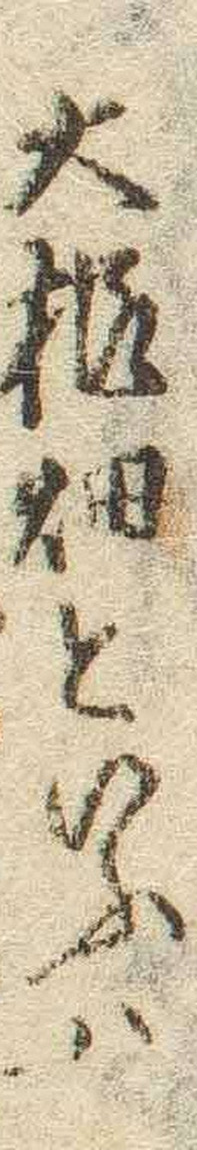大根畑といふは
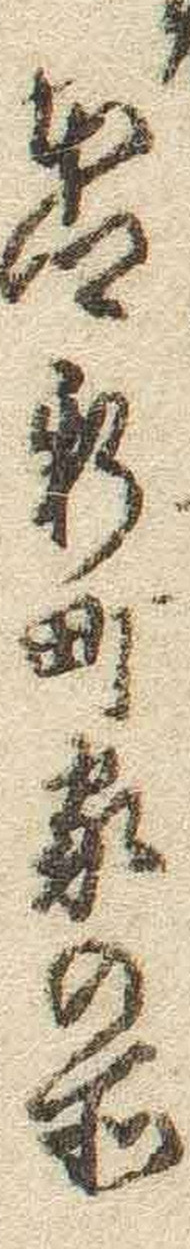本郷新町家の所
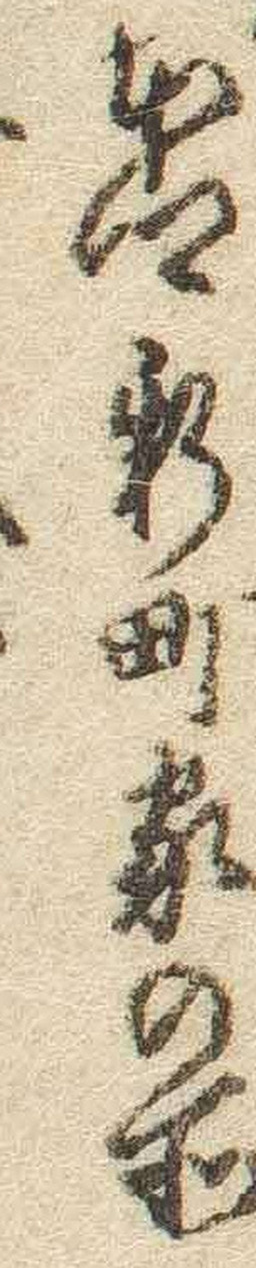本郷新町家の所
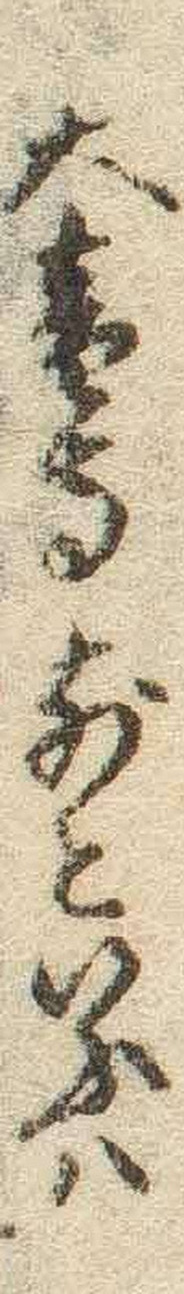大音寺前といふは
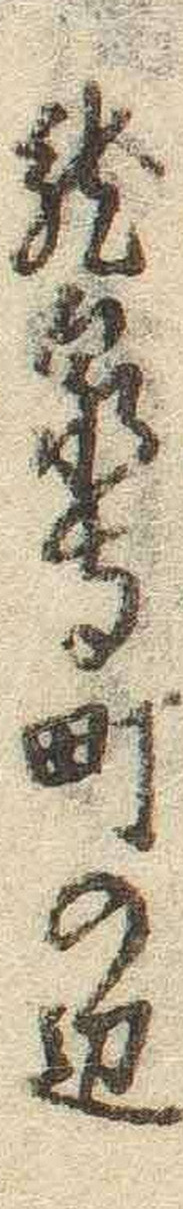竜泉寺町の辺
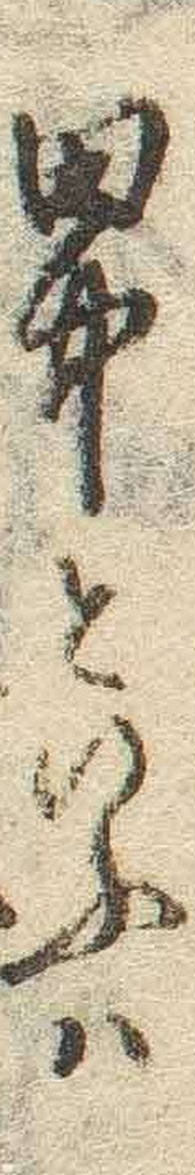田中といふは
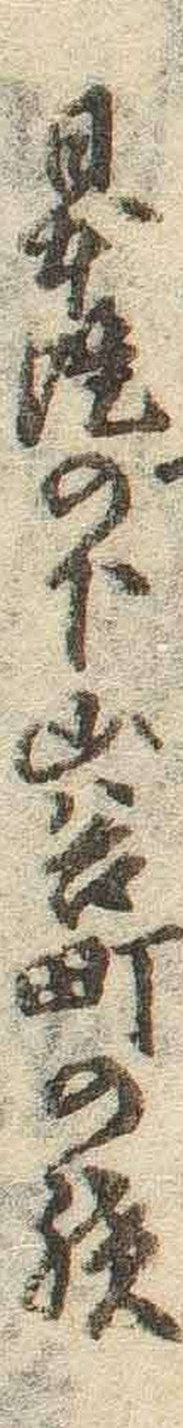日本堤の下山谷町の続
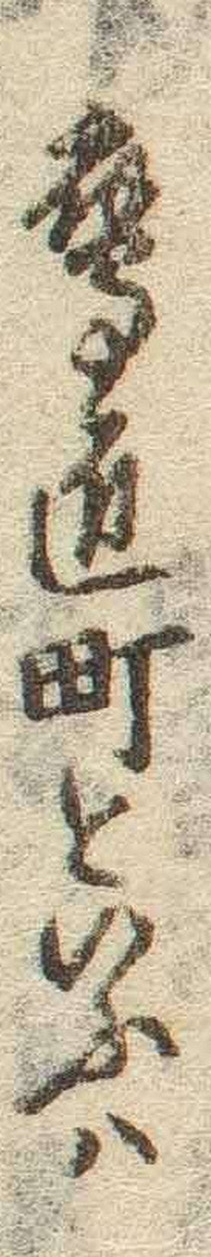鷹匠町といふは
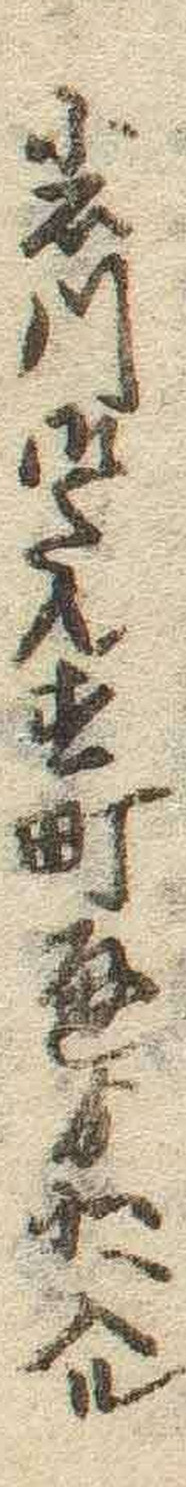小石川御たんす町通ゟ北へ入ル
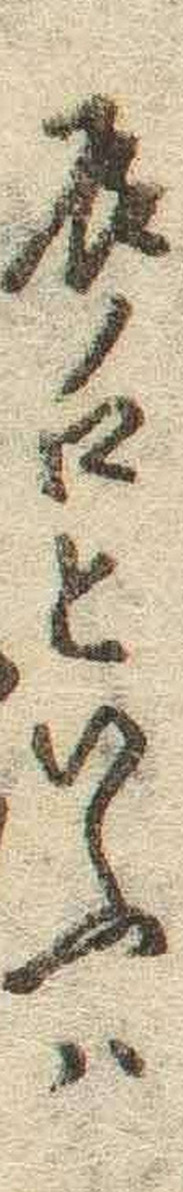辰ノ口といふは
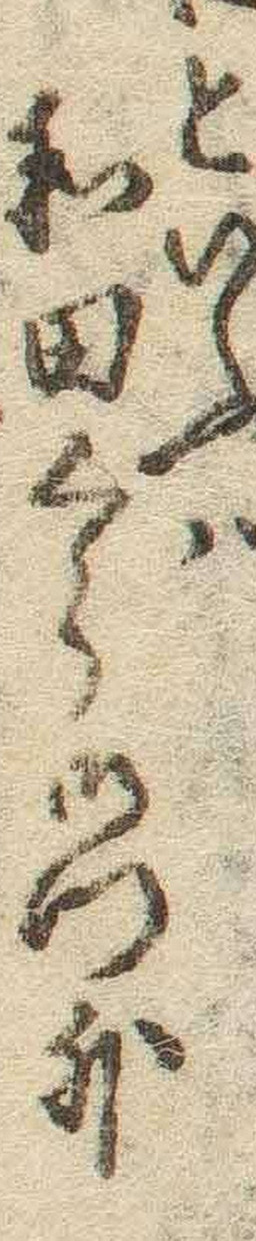和田くら御門外
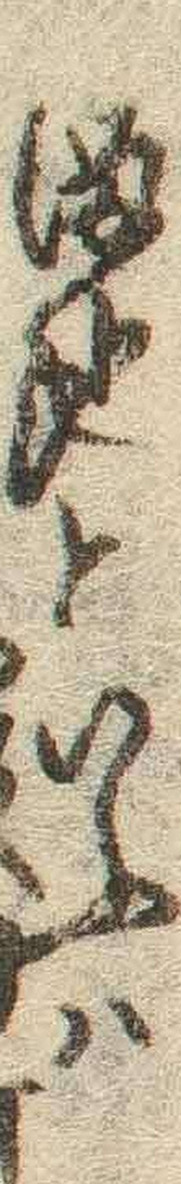田中といふは
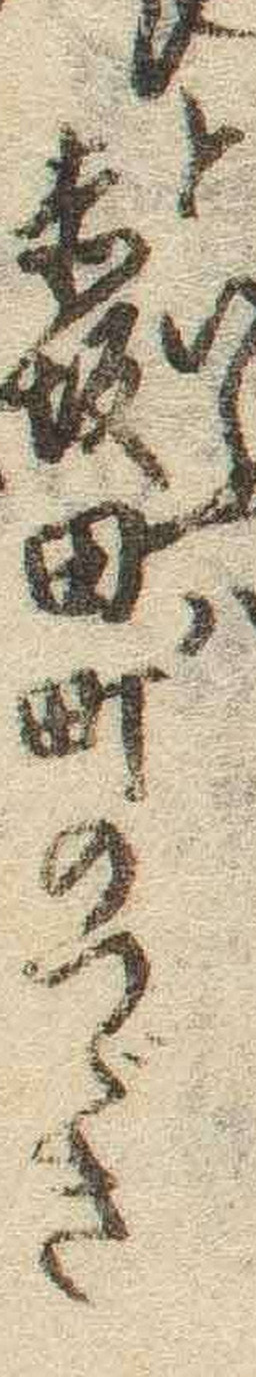赤坂田町のつゞき
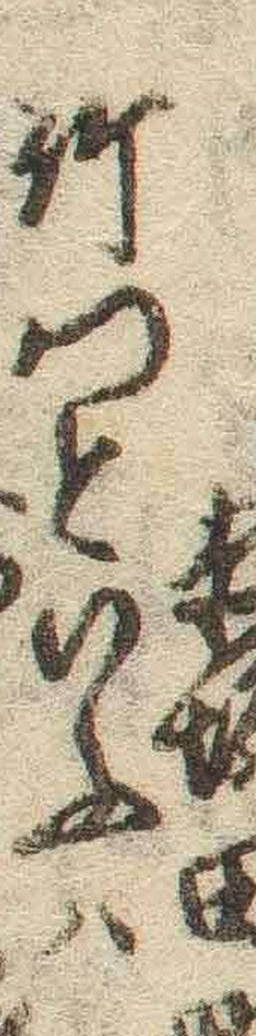竹門といふは
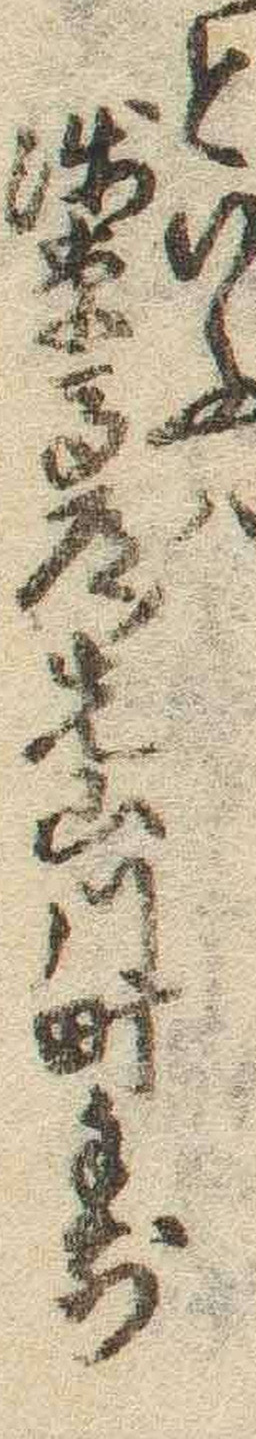浅草馬道ノ先山川町手前

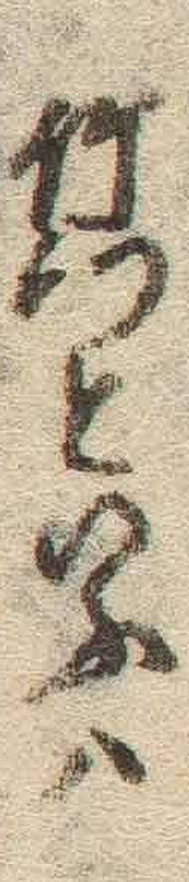竹門といふは
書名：江戸町独案内
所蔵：東京学芸大学附属図書館 国文学研究資料館
